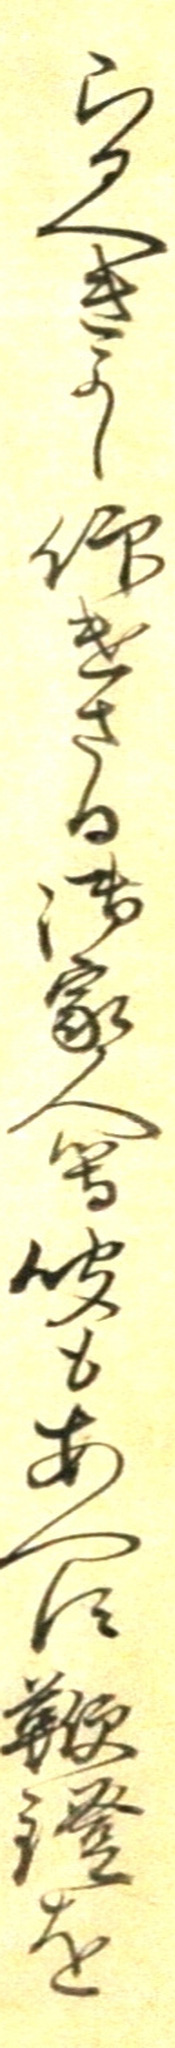らるへきよし仰遣さる御家人等もあへす鞭鐙を
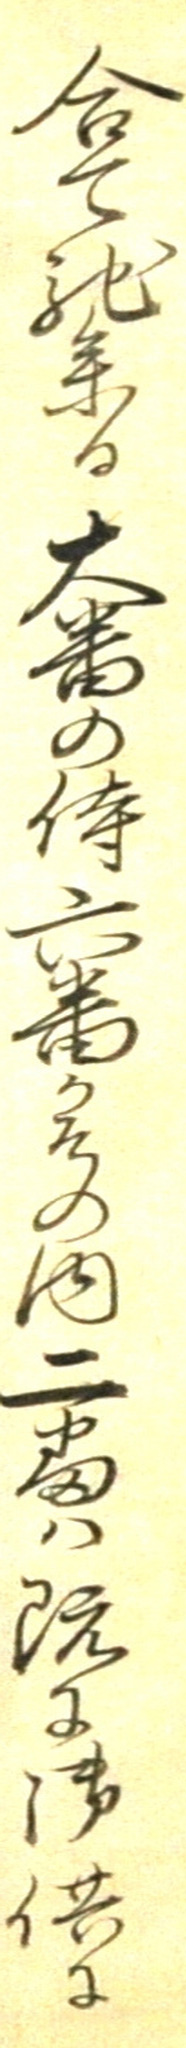合て馳参る大番の侍六番かその内二番は既に御供に
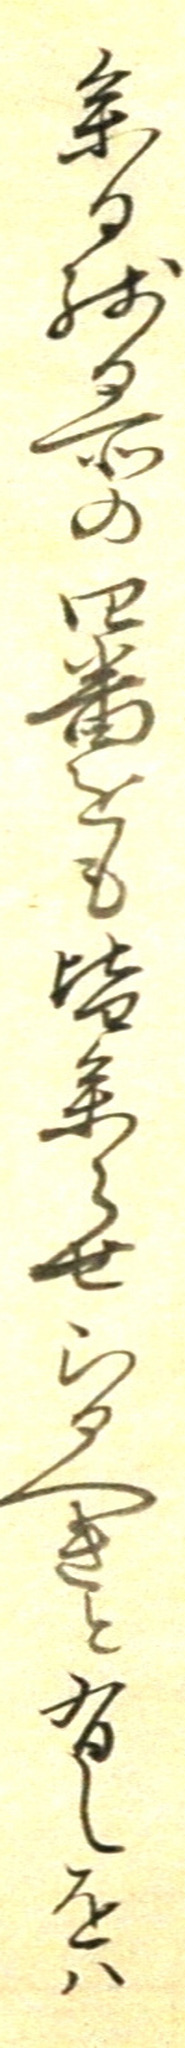参る残る所の四番をも皆参らせらるへきと有しをは
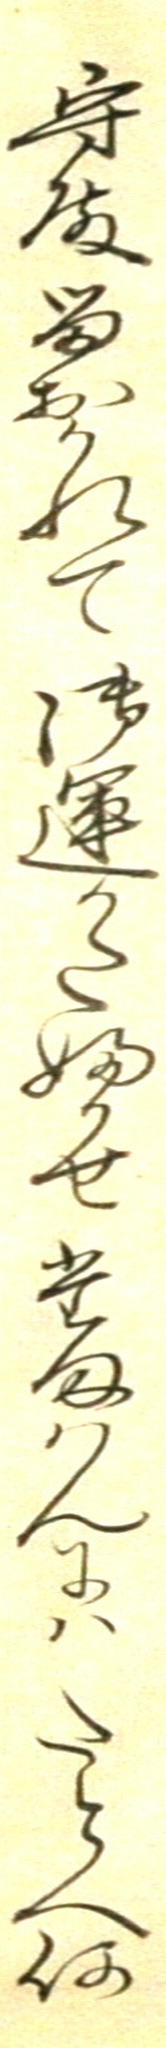守殿留おかれて御運かたふかせたまはんにはたとへ何
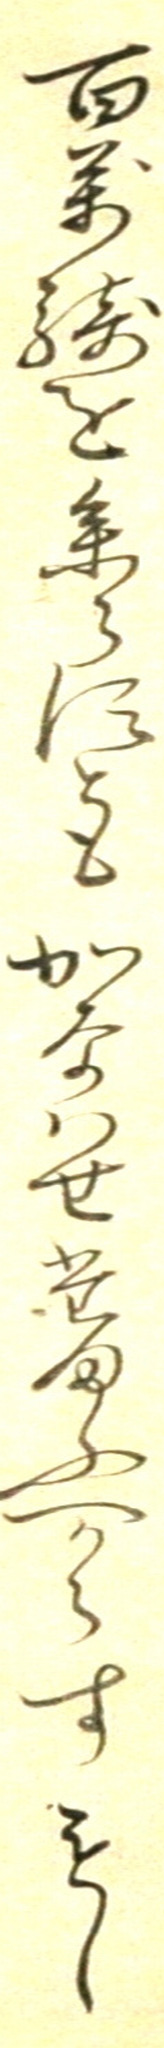百万騎を参らすともかなはせたまふへからすもし
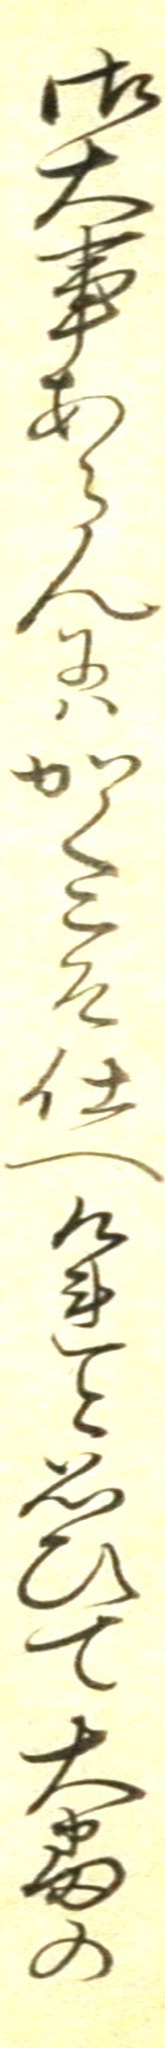御大事あらんにはかくこそ仕へけれと思ひて大番の
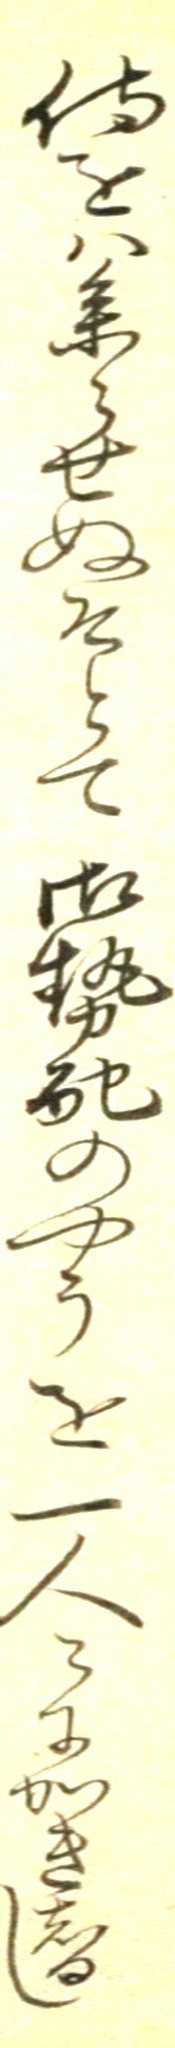侍をは参らせぬそとて御勢配のやうを一人々にかきしるし
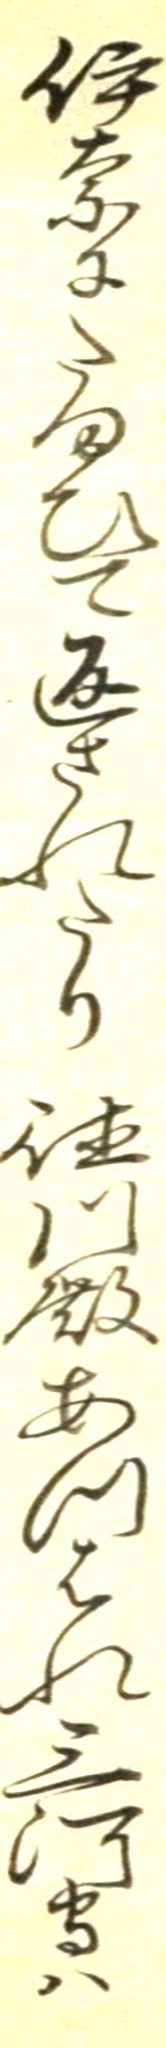伊奈にたまひて返されたり徳川殿あつはれ三河守は
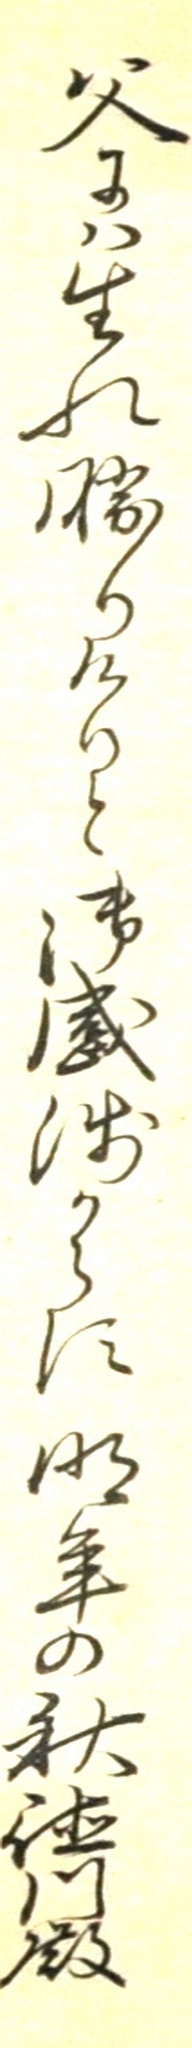父には生れ勝りけりと御感浅からす明年の秋徳川殿
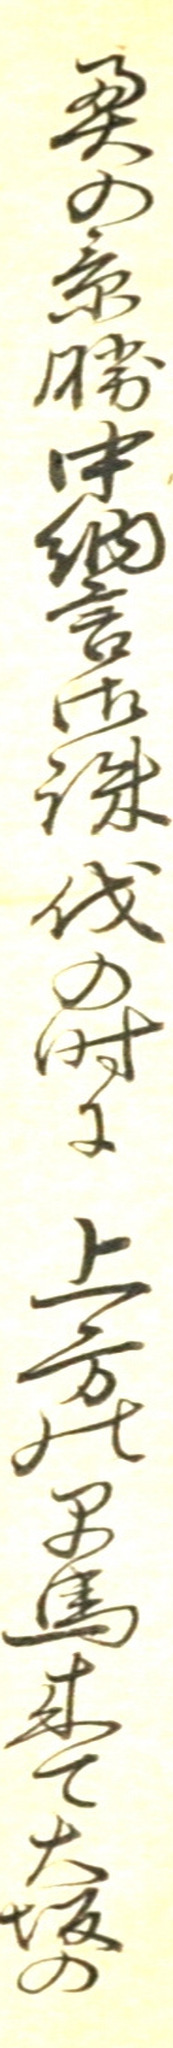奥の景勝中納言御誅伐の時に上方の早馬来て大坂の
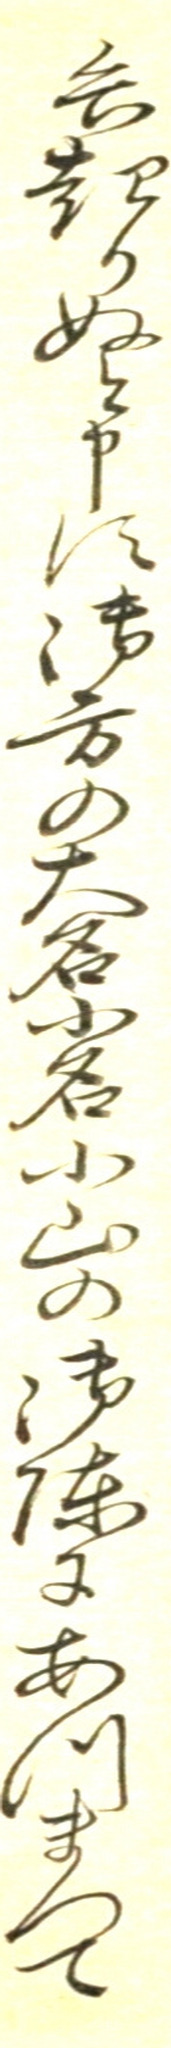兵起りぬと申す御方の大名小名小山の御陣にあつまつて
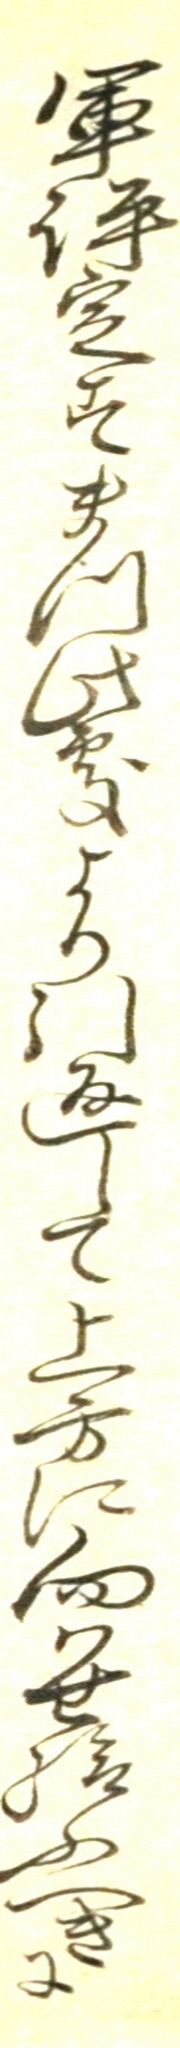軍評定すまつ此処より引返して上方に向はせ給ふへきに
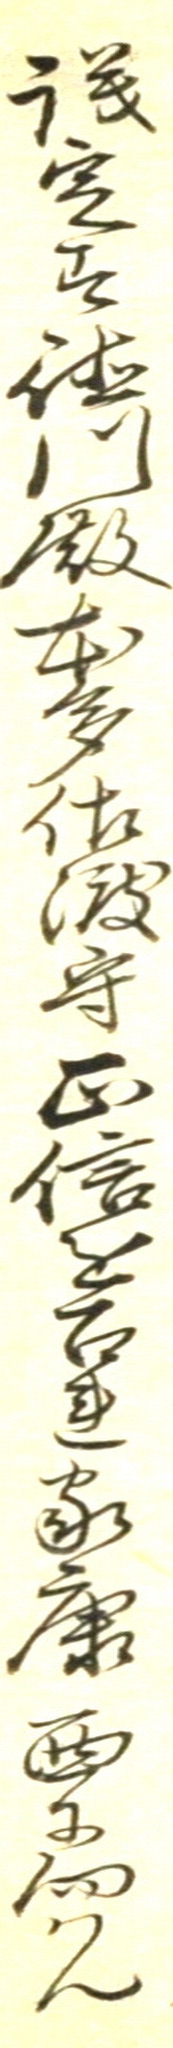議定す徳川殿本多佐渡守正信を召れ家康西に向はん
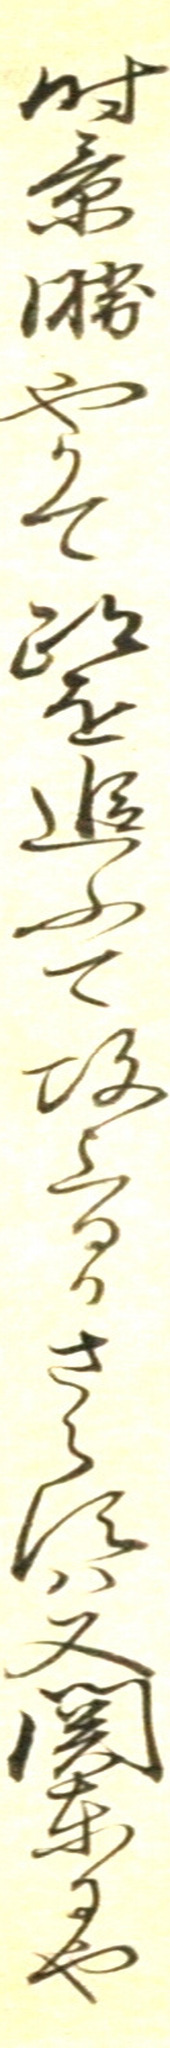時景勝やかて跡を追ふて攻上るかさらすは又関東にや
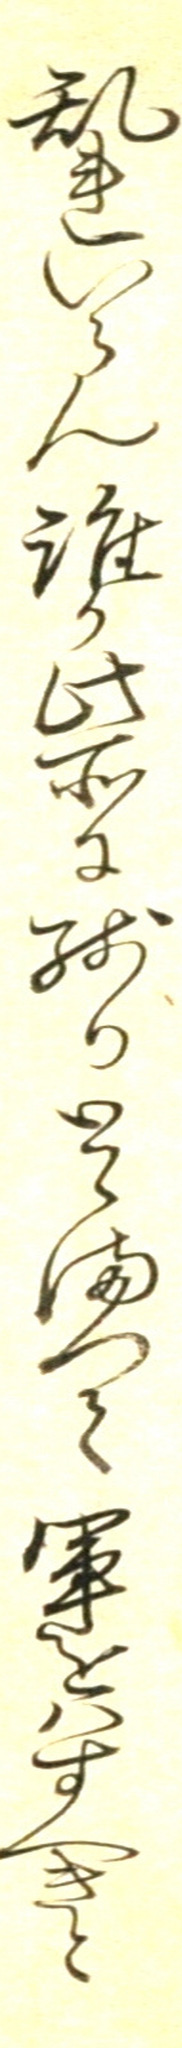乱れいらん誰か此所に残りとゝまつて軍をはすへきと
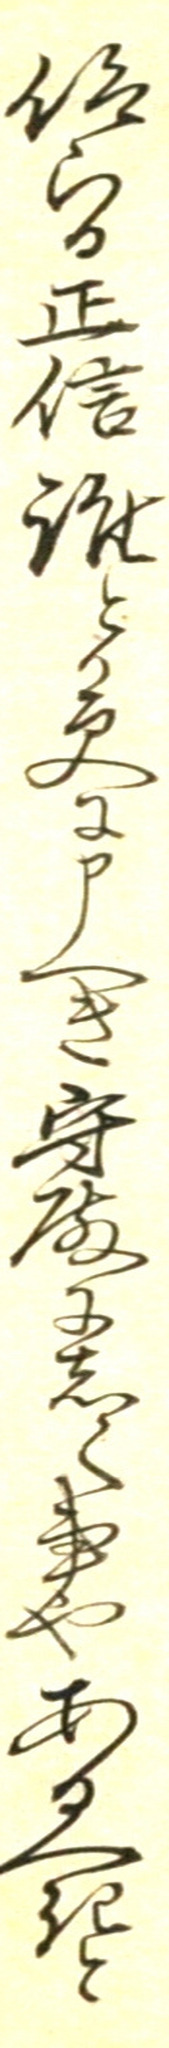仰らる正信誰とか更に申へき守殿にしく事やあるへきと
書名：藩翰譜（一）
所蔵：伊那市立高遠町図書館・合同会社AMANE
